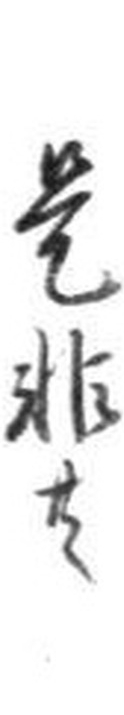是非共
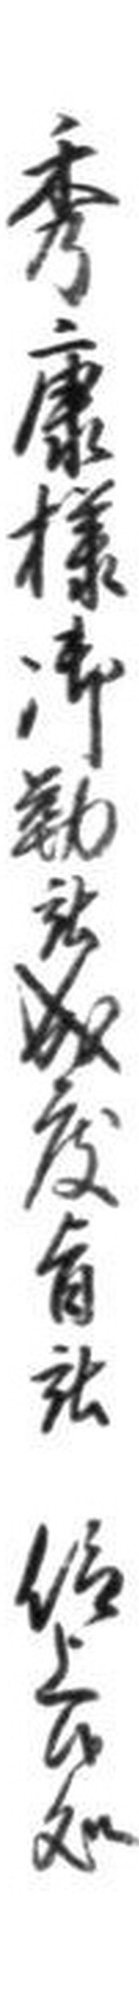秀康様御勤被成度旨被仰上候処
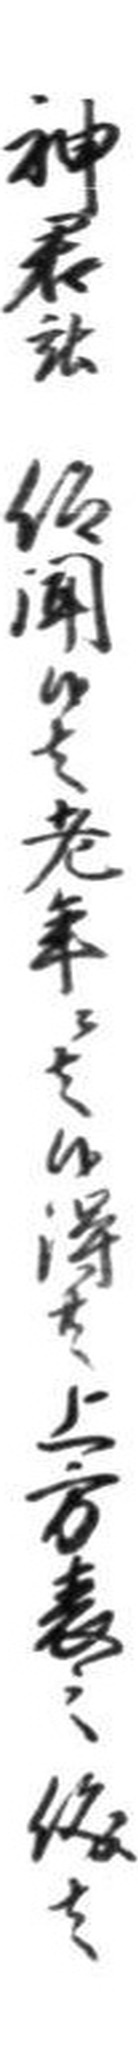神君被仰聞候者老年ニ者候得共上方表之儀者
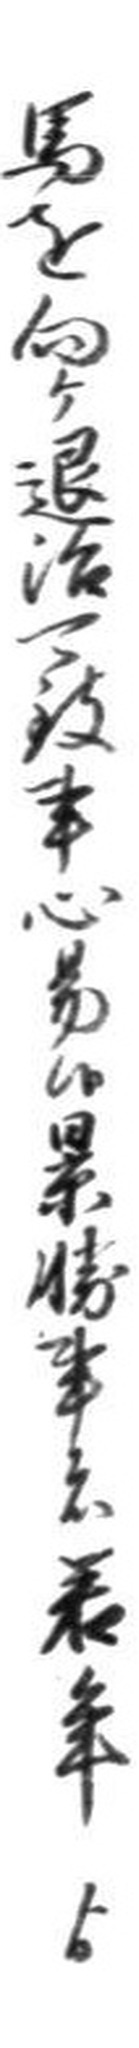馬を向ケ退治可致事心易候景勝事者若年ゟ
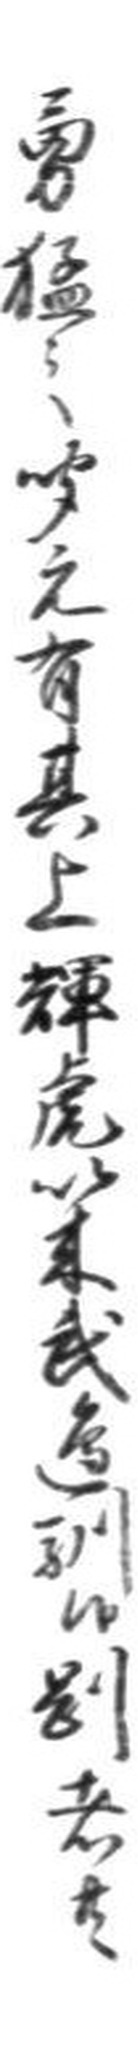勇猛之聞元有其上輝虎以来武辺馴候剛者共
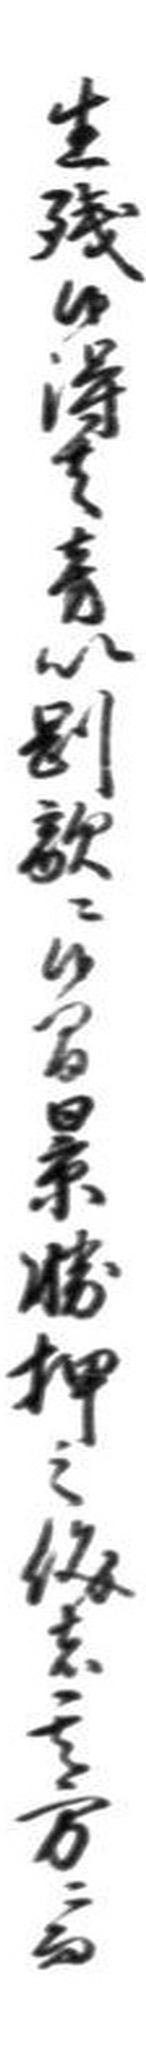生残候得者旁以剛敵ニ候間景勝押之儀者其方ニ而
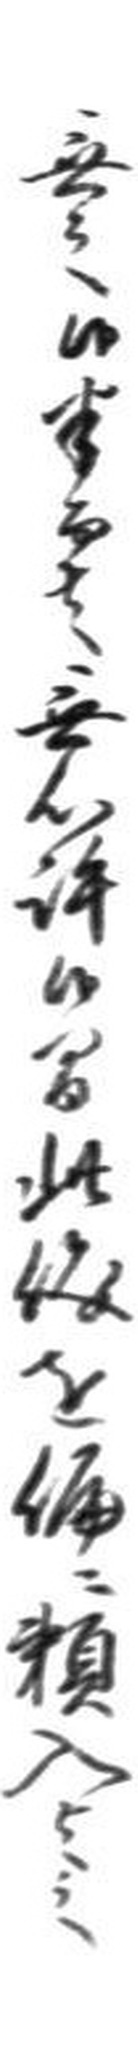無之候半而者無心許候間此儀を偏ニ頼入と之
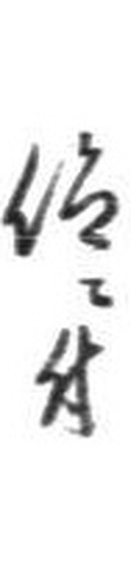仰ニ付
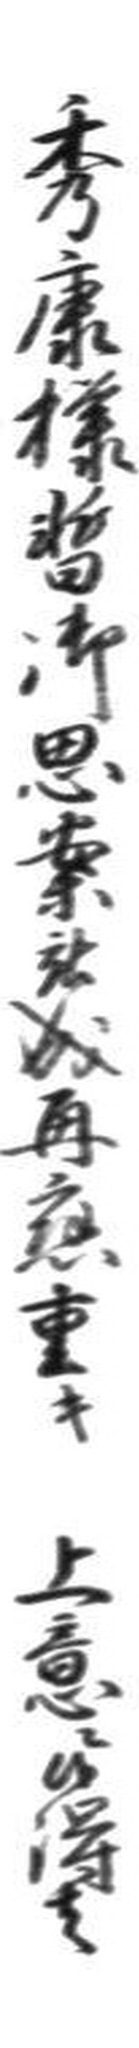秀康様暫御思案被成再応重キ上意ニ候得者
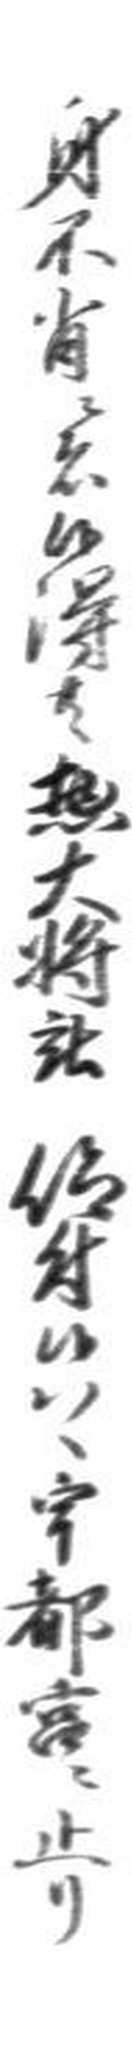身不肖ニ者候得共惣大将被仰付候ハヽ宇都宮ニ止リ
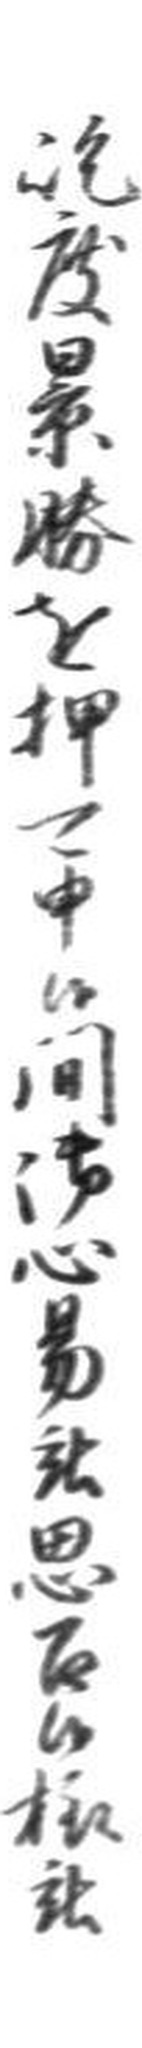屹度景勝を押可申候間御心易被思召候様被
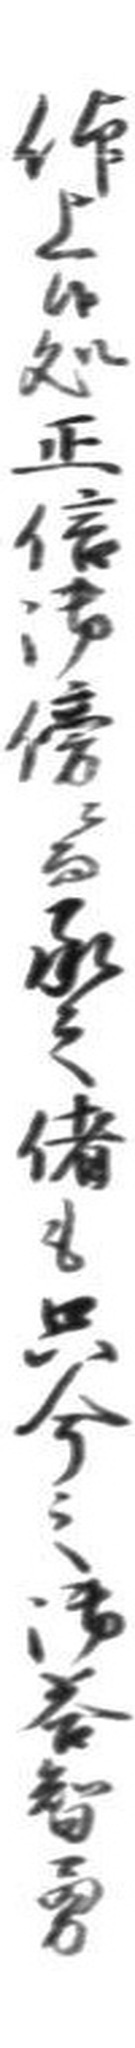仰上候処正信御傍二而承之偖も只今之御答智勇
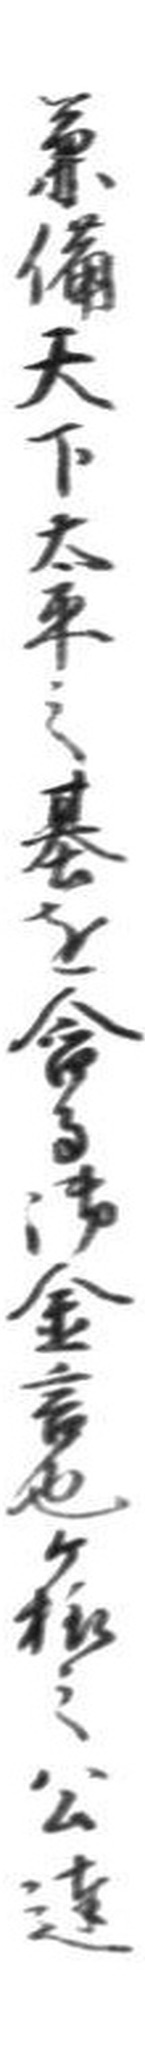兼備天下太平之基を含る御金言也ケ様之公達
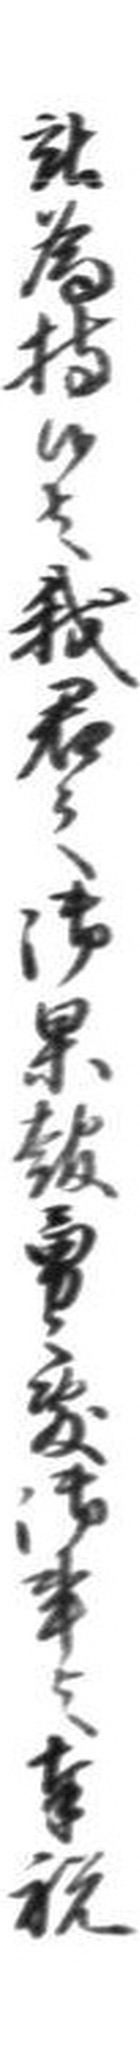被為持候者我君之御果報勇々敷御事と奉祝

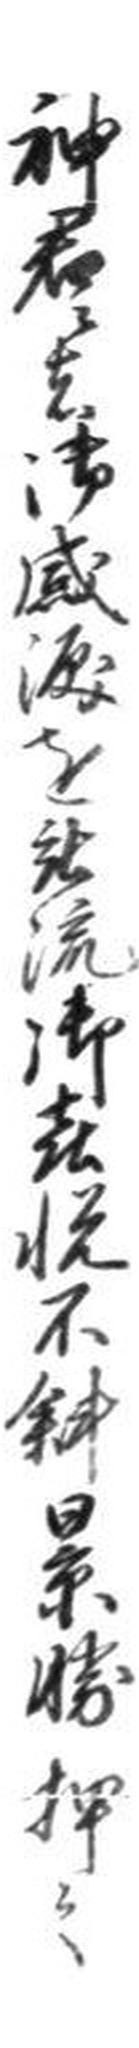神君ニ者御感涙を被流御喜悦不斜景勝押之
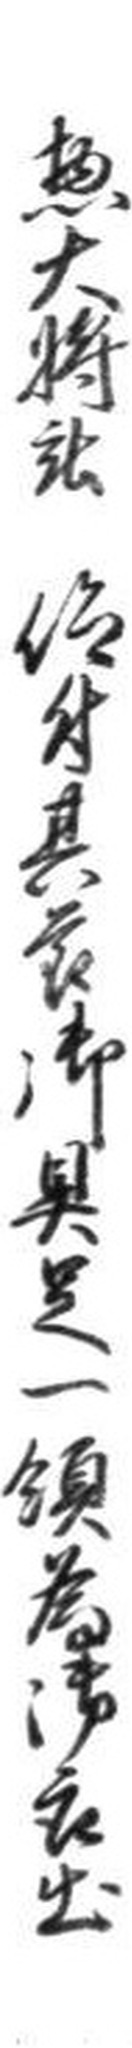惣大将被仰付其節御具足一領為御取出
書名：家譜 一 秀康公 従天正二年到慶長十二年
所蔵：福井県文書館 Fukui Prefectural Archives
